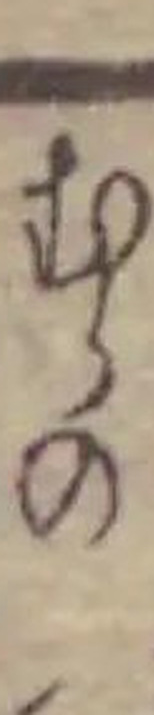むらの
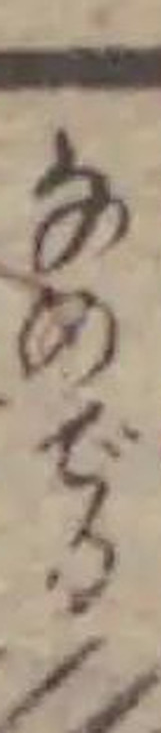なのでる
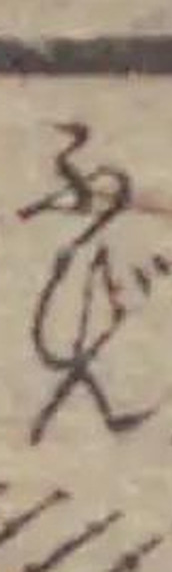ふびん
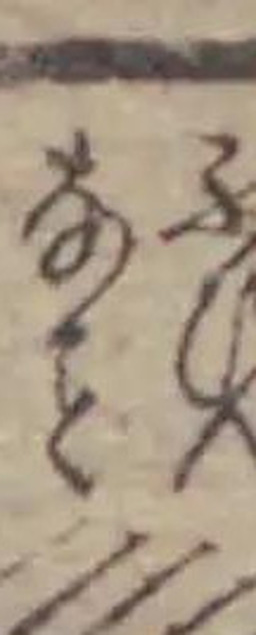なこと
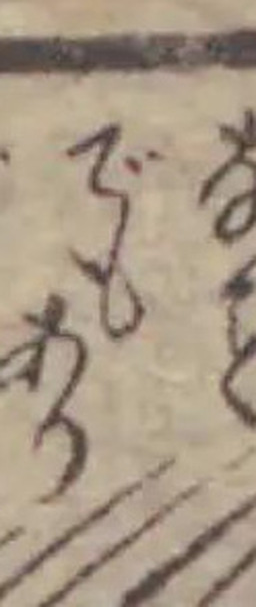でもあり
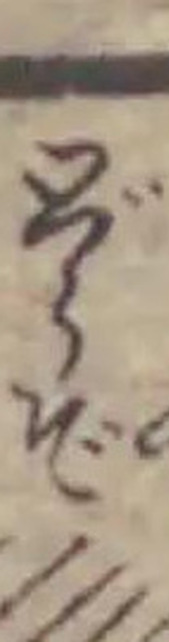どうぞ
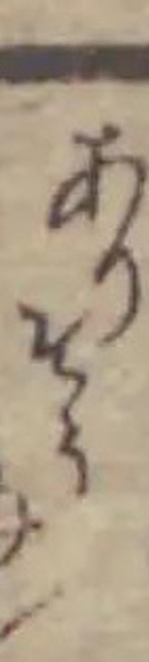ありそうな

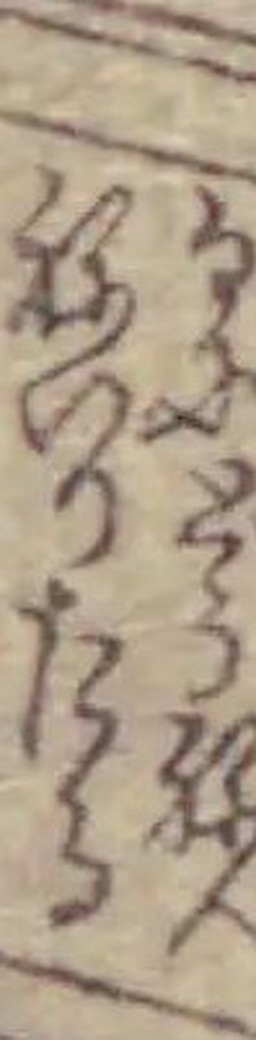はいりける
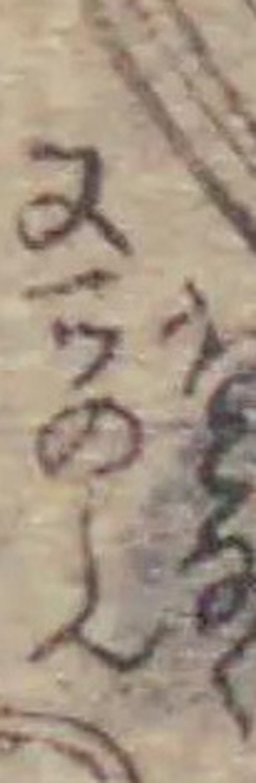又一つのしん
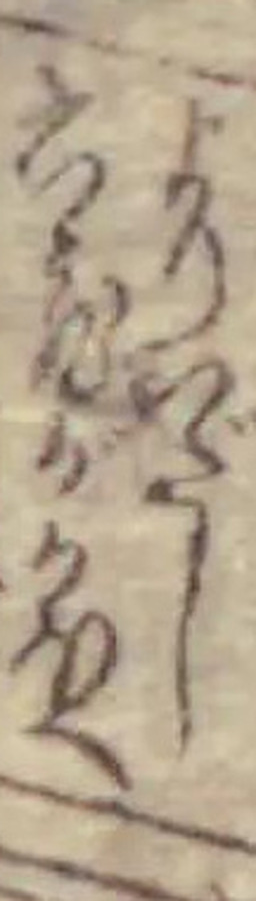六蔵がかほへ
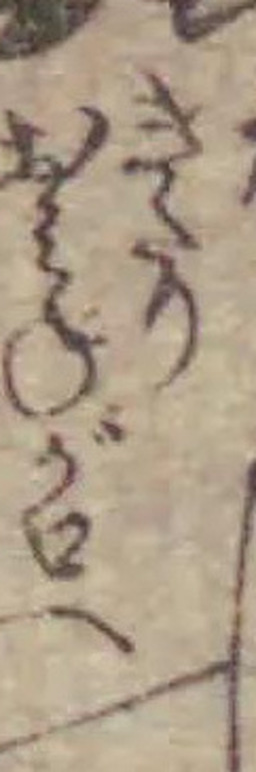おみねが口へ
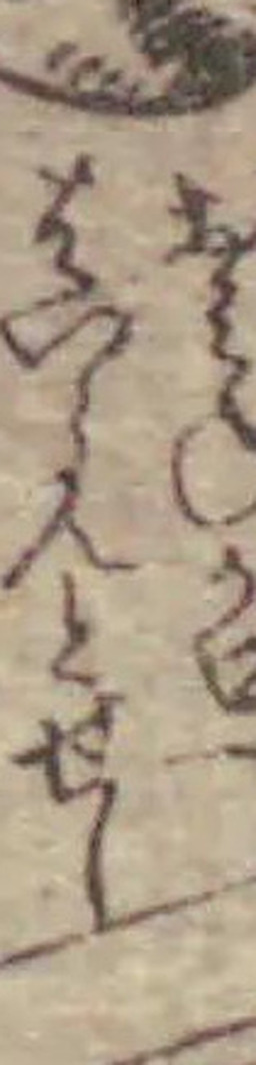はいらんとせし
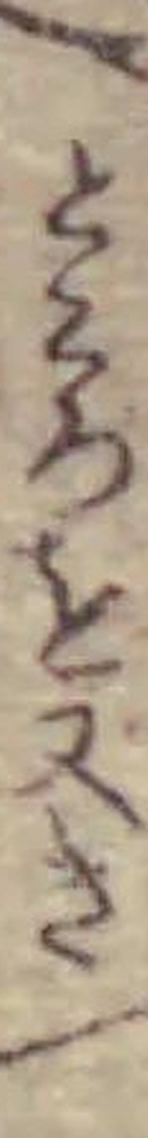ところを又き
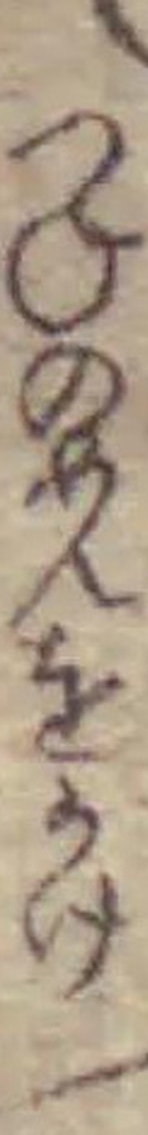つねのめんをかけ
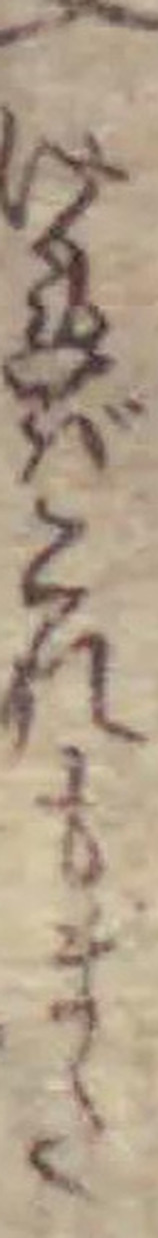ければこれもまた
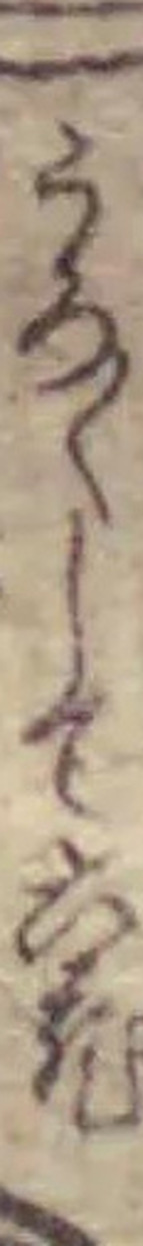うろ〳〵して六蔵が
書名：飛た間違矢口噂 2巻
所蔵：国立国会図書館 National Diet Library, JAPAN
